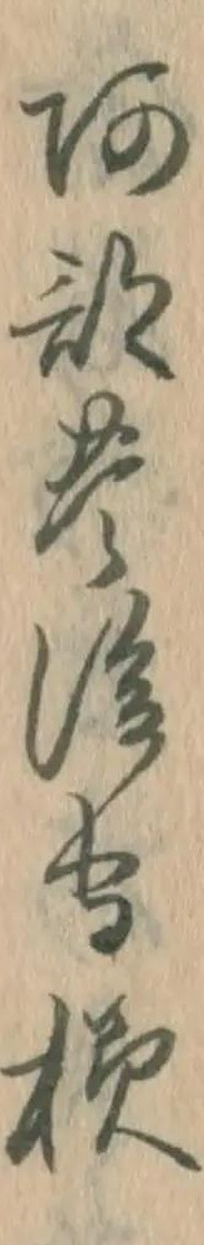阿部豊後守様
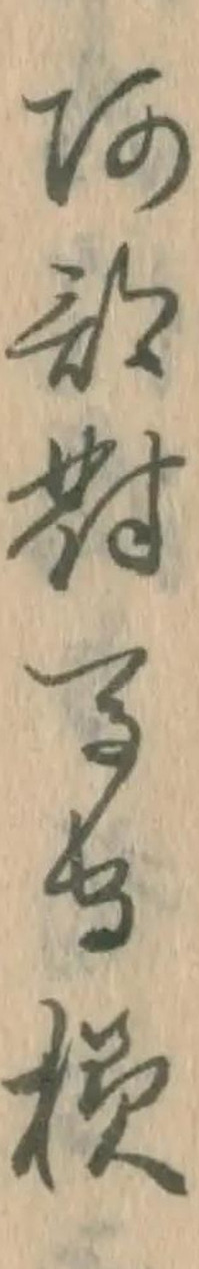阿部対馬守様
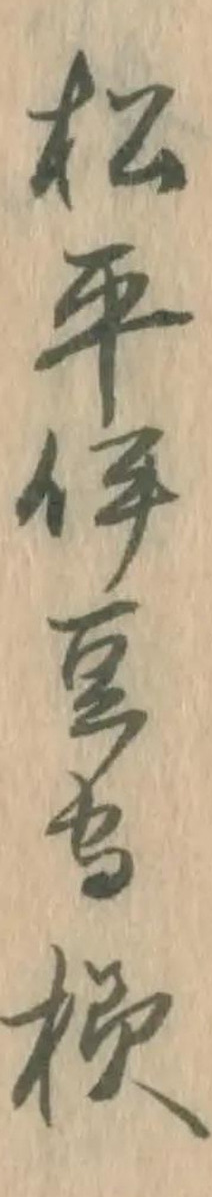松平伊豆守様

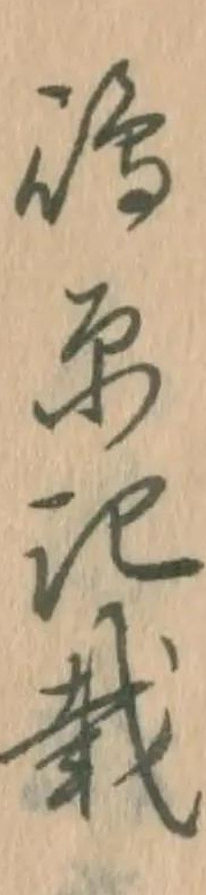島原記載
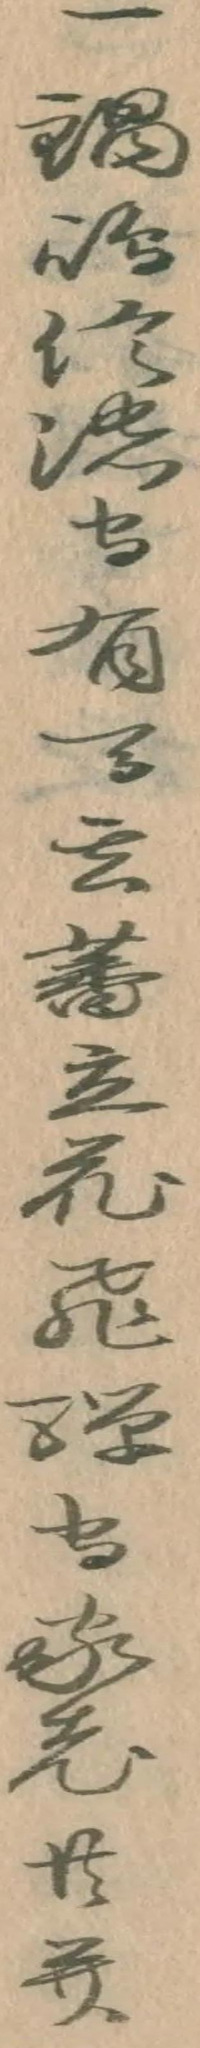一鍋島信濃守有馬玄蕃立花飛騨守家老共幷
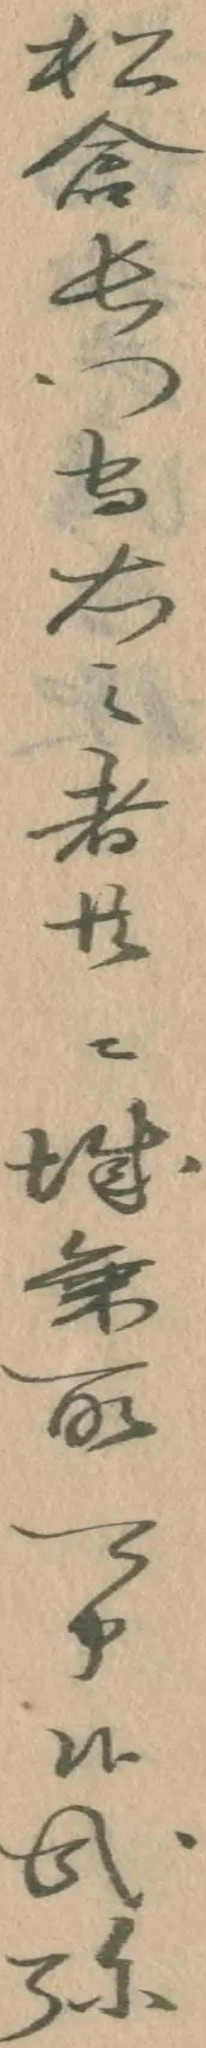松倉長門守右之者共に城乗取可申候哉弥
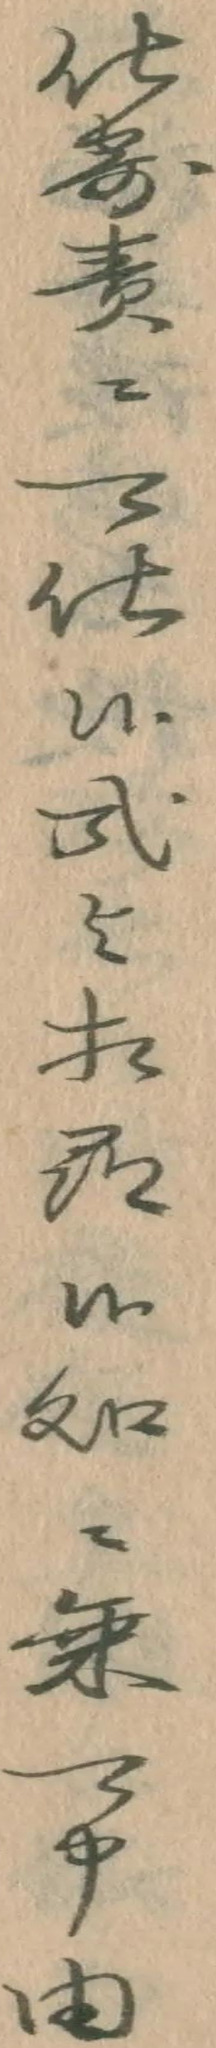仕寄責に可仕候哉与相尋候処に乗可申由
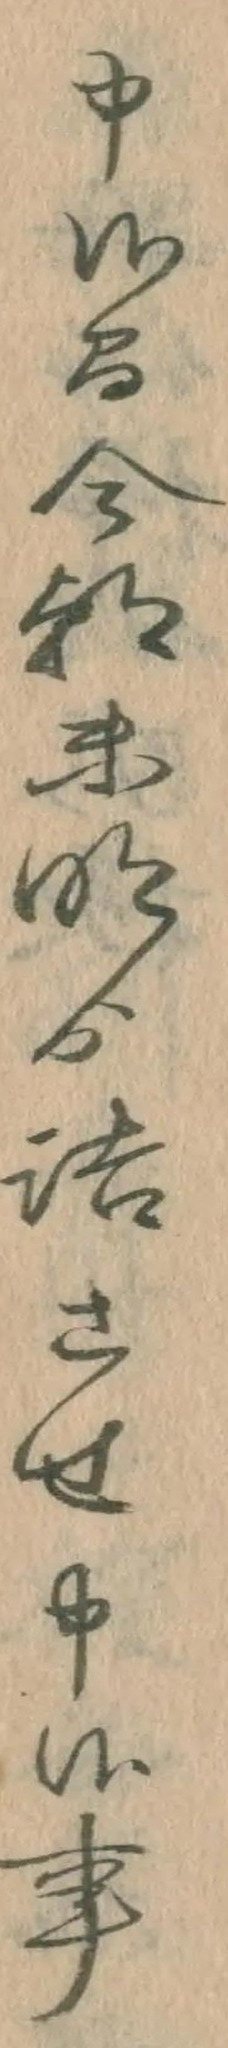申候間今朝未明ゟ詰させ申候事
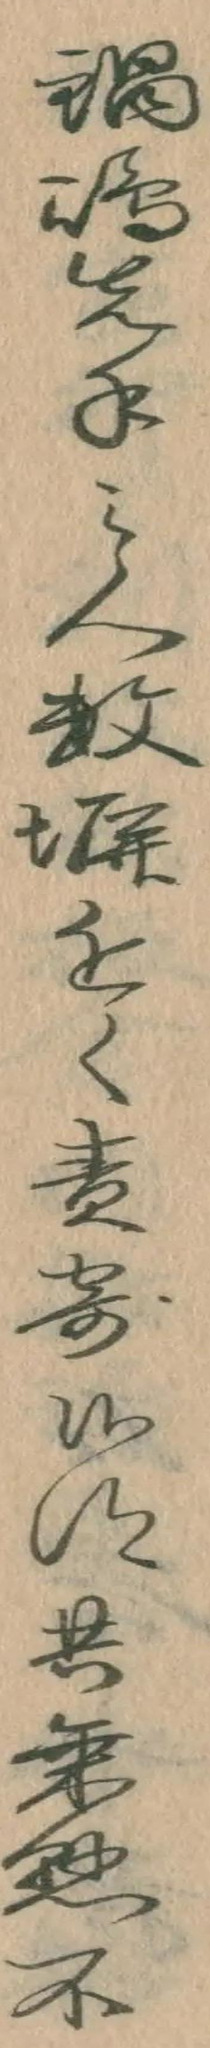一鍋島先手之人数塀近く責寄候得共乗懸不
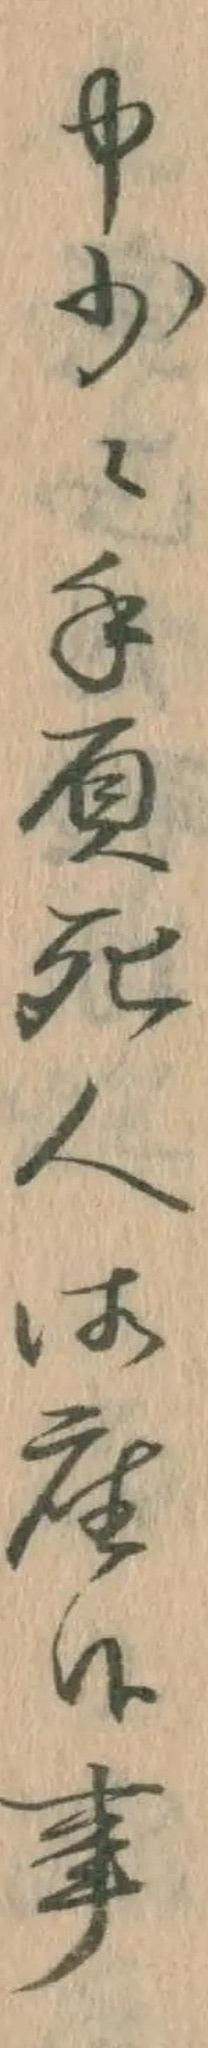申少々手負死人御座候事
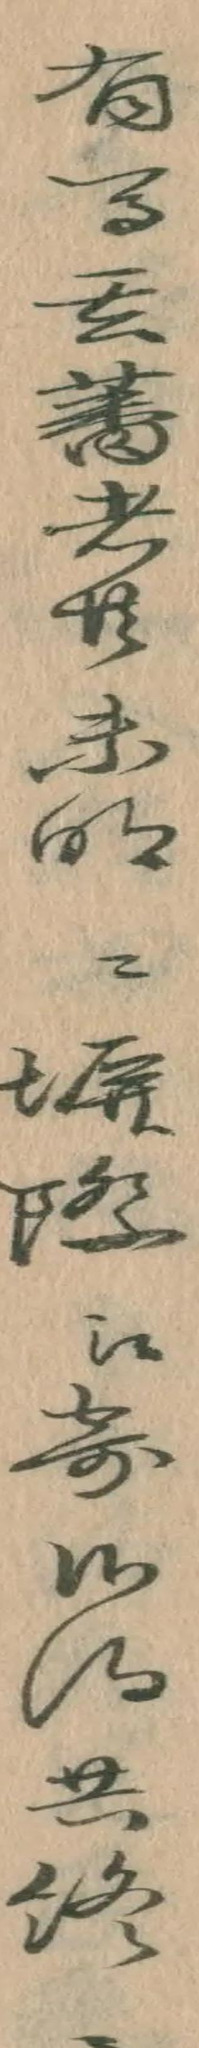一有馬玄蕃者共未明に塀際江寄候得共終に
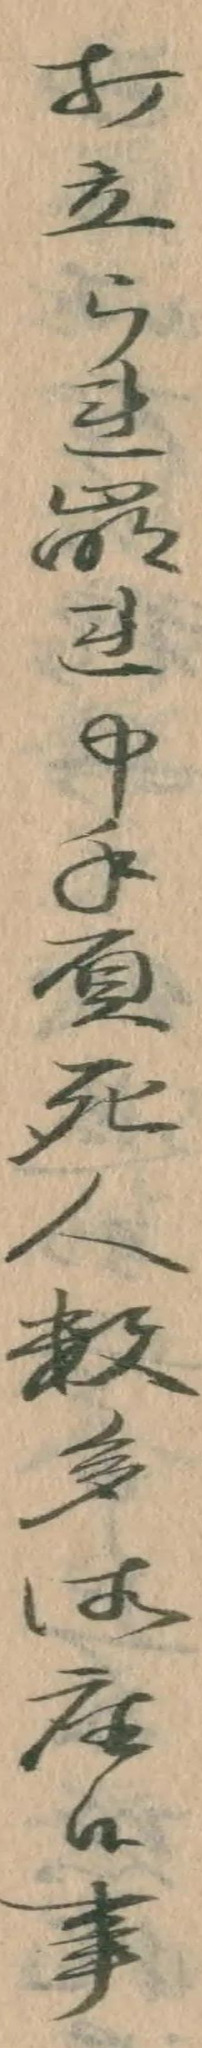打立ら連崩連申手負死人数多御座候事
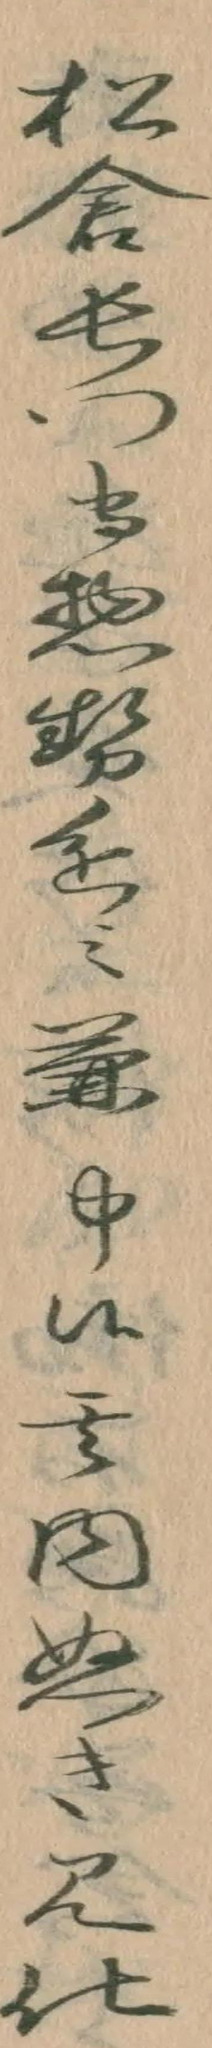一松倉長門守惣勢進み兼申候其内怒き見仕
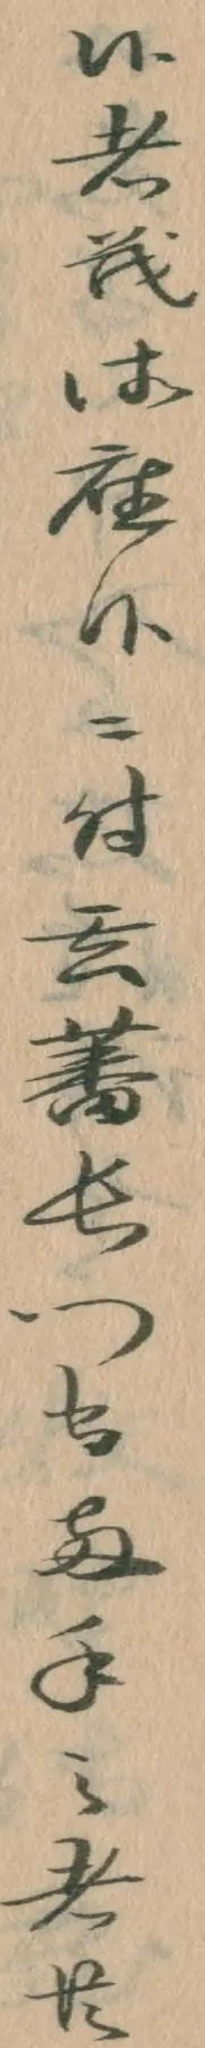候者茂御座候に付玄蕃長門守両手之者共
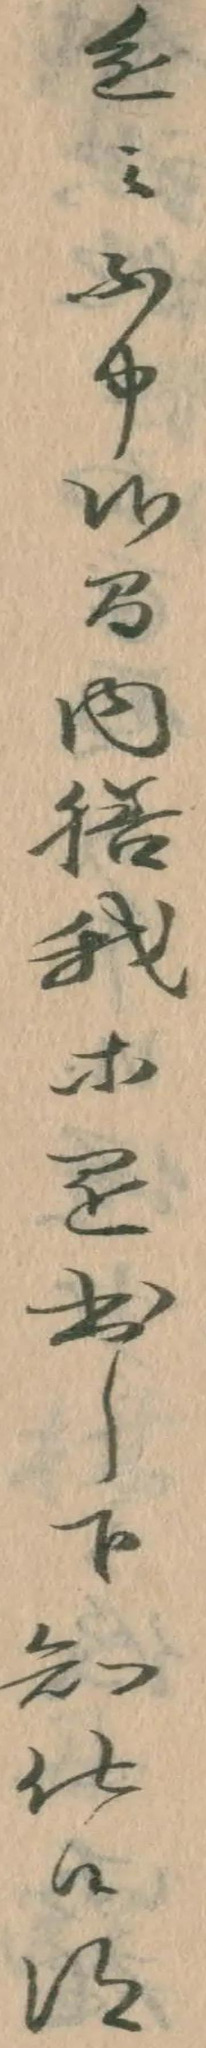進みふ申候間内膳我等懸出し下知仕候得
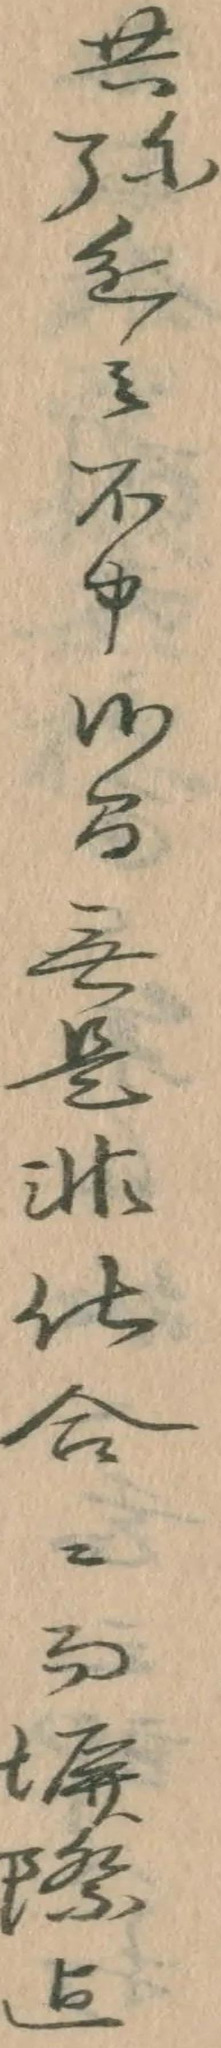共弥進み不申候間無是非仕合に而塀際迄
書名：切支丹御退治記 49巻. [5]
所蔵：国立国会図書館 National Diet Library, JAPAN
